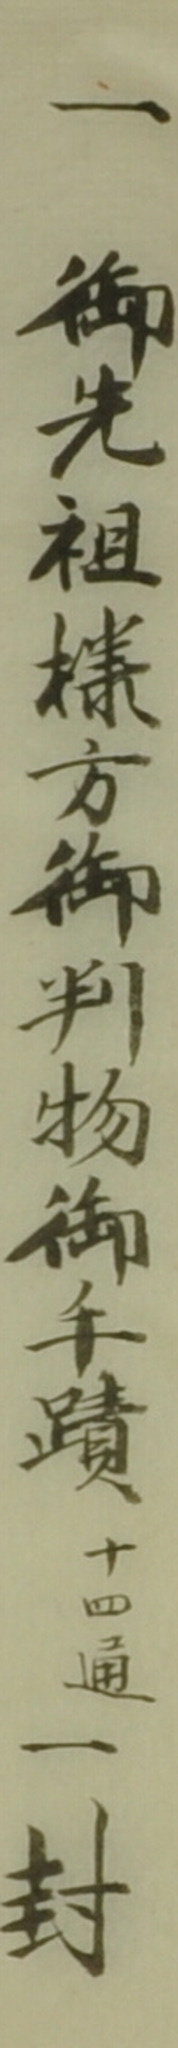一御先祖様方御判物御手蹟十四通一封
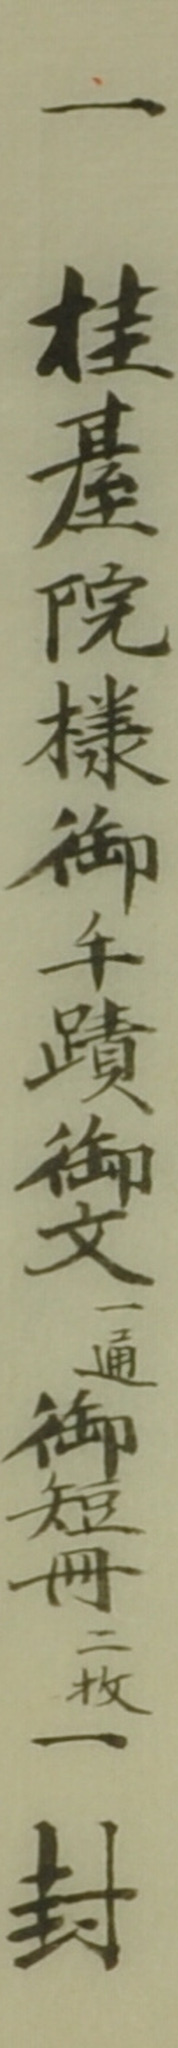一桂臺院様御手蹟御文一通御短冊二枚
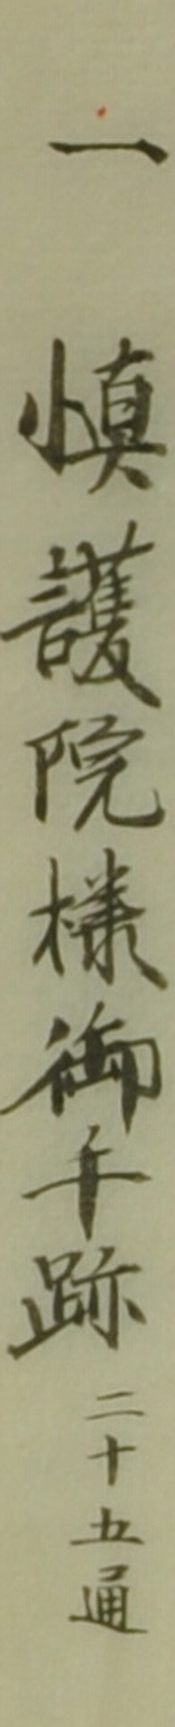一慎護院様御手跡二十五通
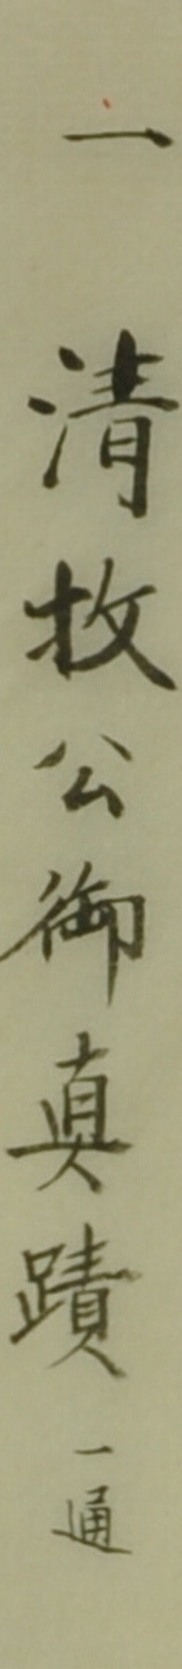一清枚公御真蹟一通

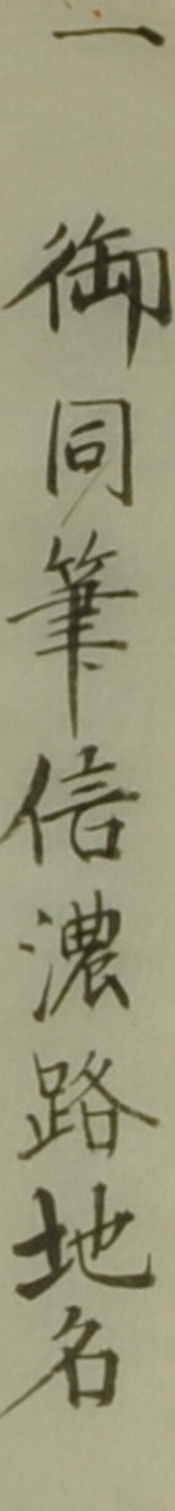一御同筆信濃路地名

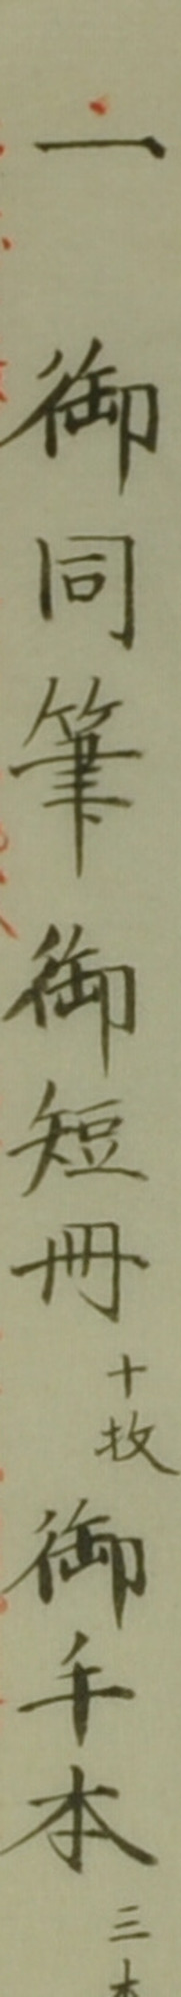一御同筆御短冊十枚御手本三本
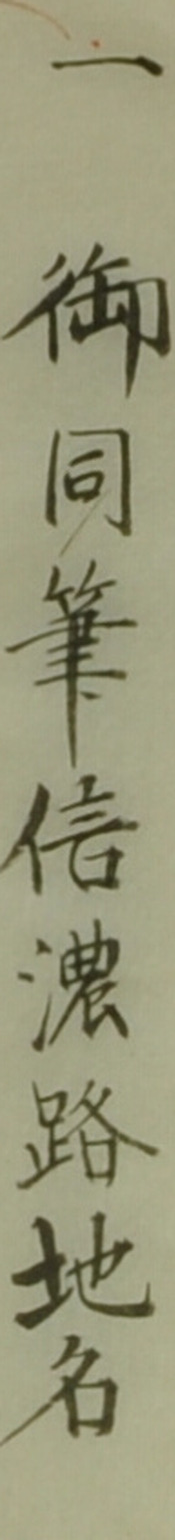一御同筆信濃路地名
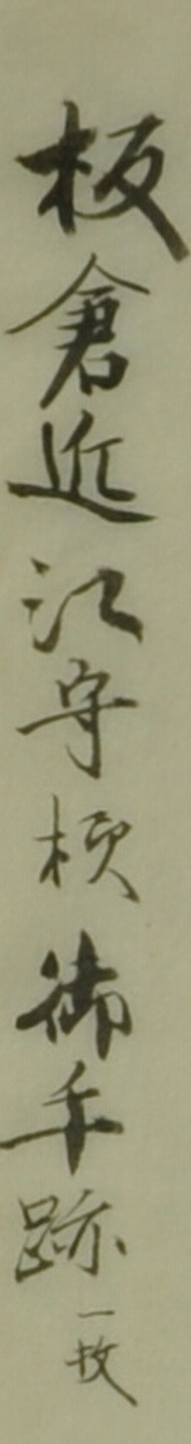一板倉近江守様御手跡一枚
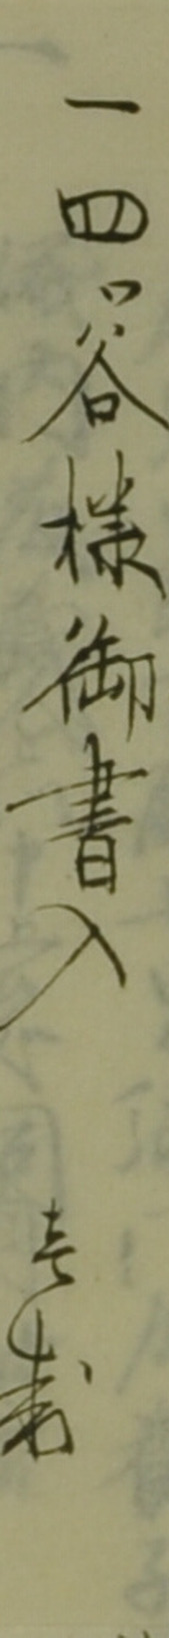一四ッ谷様御書入一書
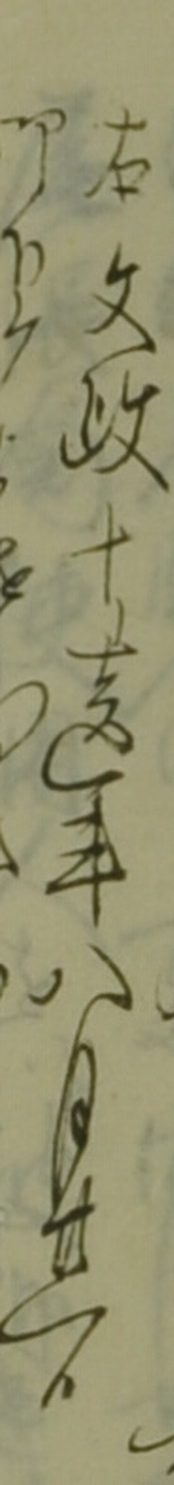右文政十丁亥年八月廿一日

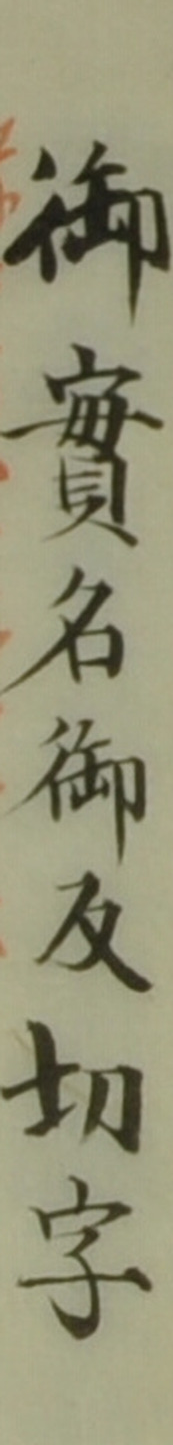一御實名御切字
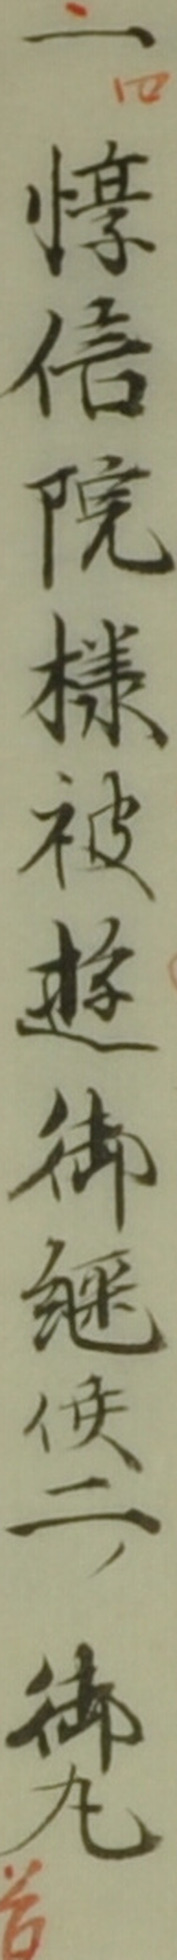一惇信院様被御継使候ニノ御丸
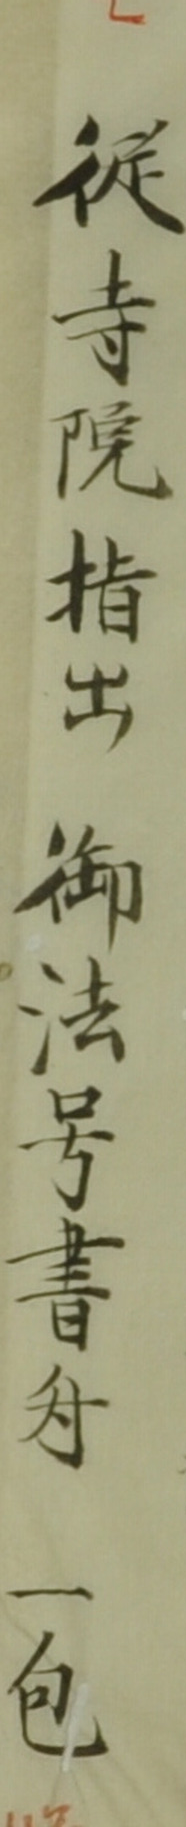一従寺院差出御法号書付一包

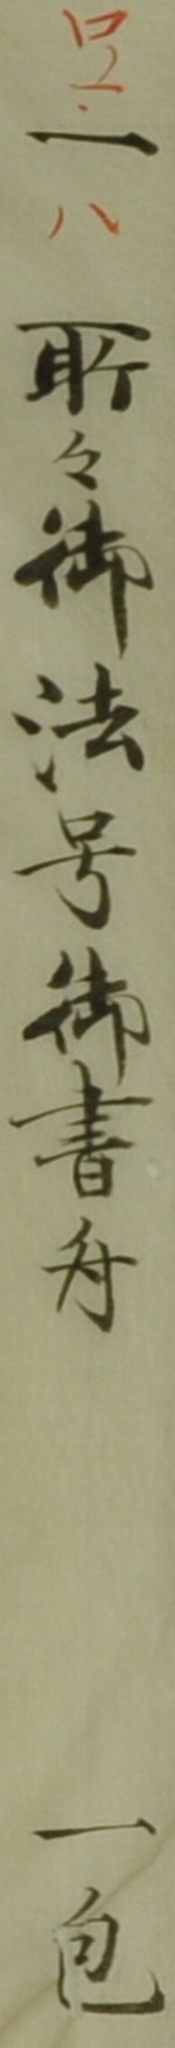一取次御法号御書付一包
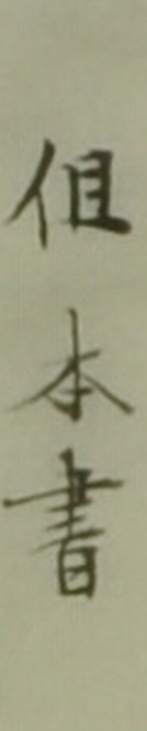但本書
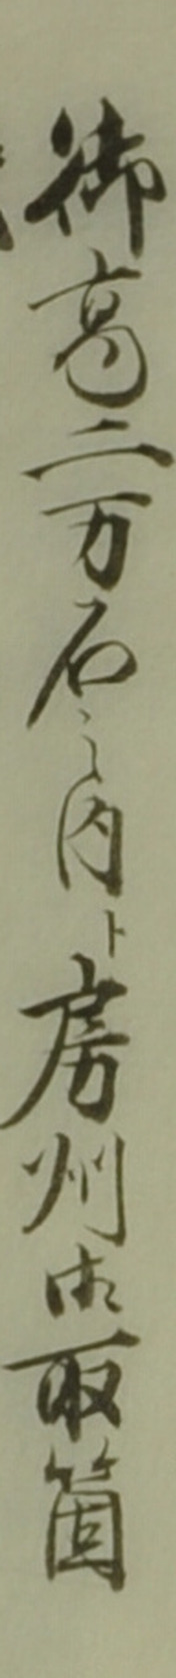御高二万石内ト房州箇
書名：御直筆御書付類調帳
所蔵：伊那市立高遠町図書館・合同会社AMANE
